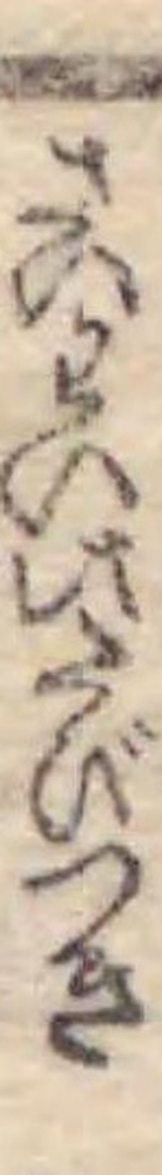さいわい此たびつき
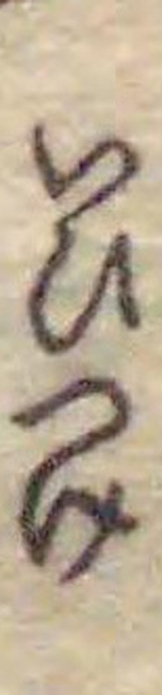いひつけ
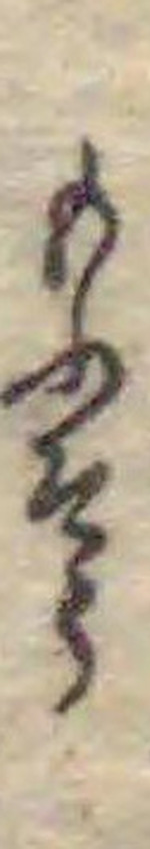もふそう
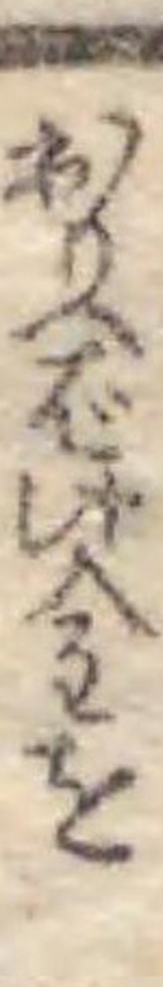おもへば此金を
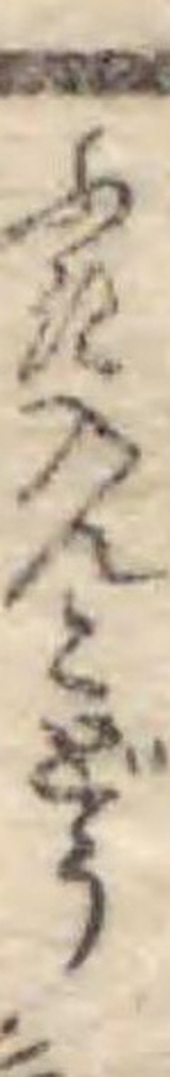ふき入んとどう
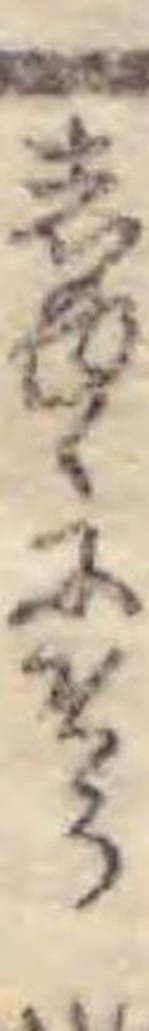しゆくにそう
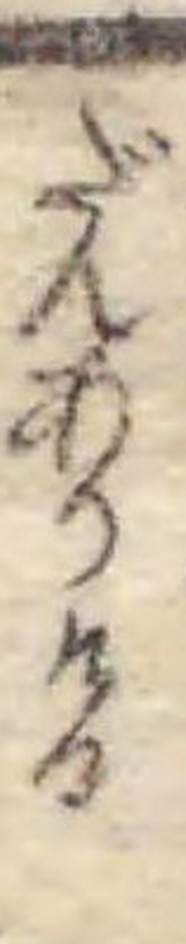だんありける
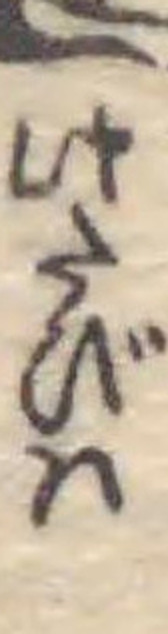此たびは
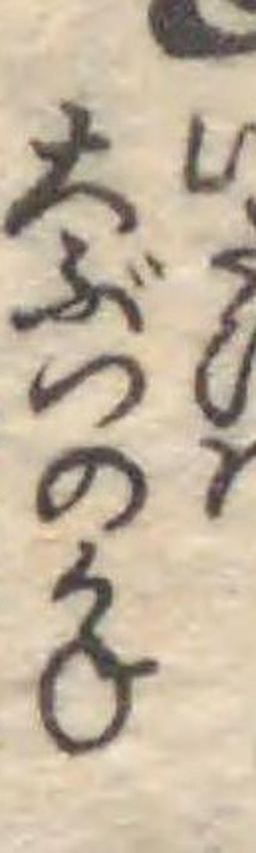大ぶつのかね
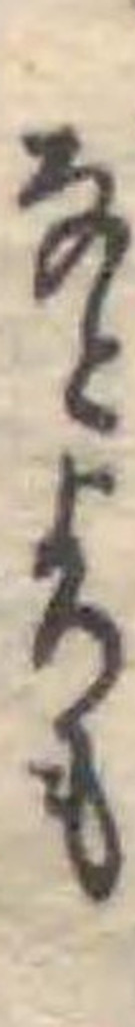なとよりも
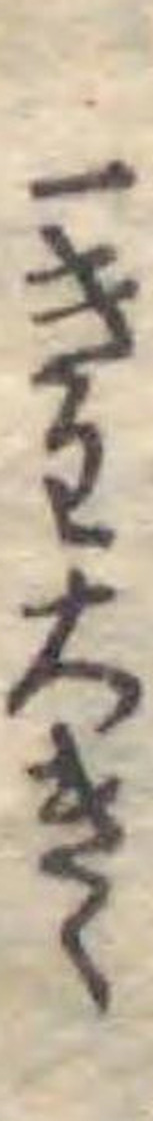一きわ大きく
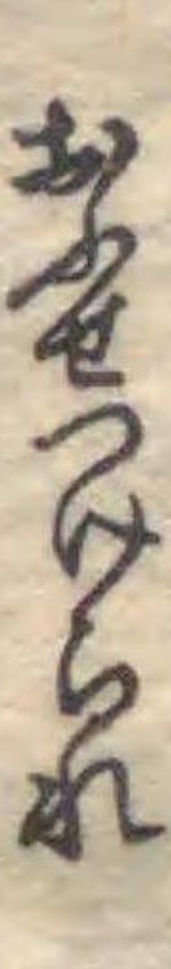おふせつけられ
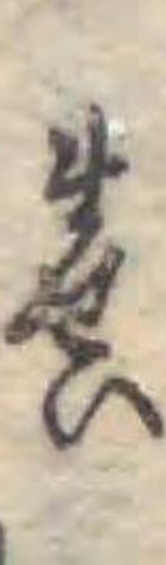ませい
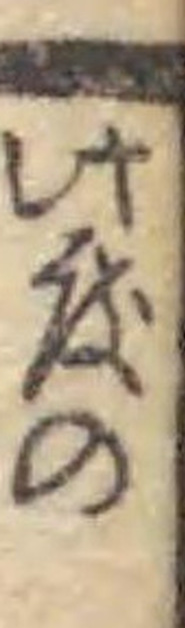此度の
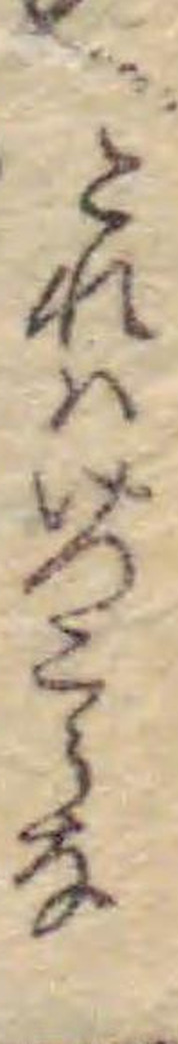これはけつこうな
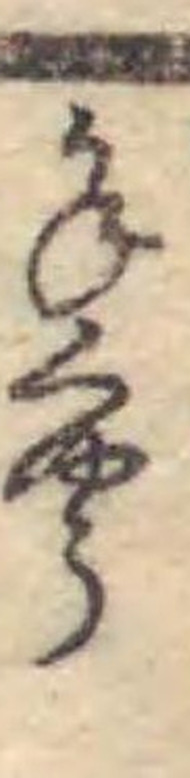かねくやう
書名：鐘入七人化粧 : 3巻
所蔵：国立国会図書館 National Diet Library, JAPAN
